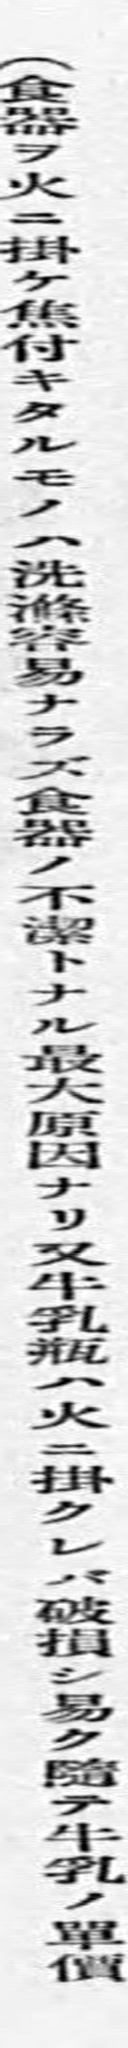(食器ヲ火ニ掛ケ焦付キタルモノハ洗浄容易ナラズ食器ノ不潔トナル最大原因ナリ又牛乳瓶ハ火ニ掛クレバ破損シ易ク随テ牛乳ノ単価
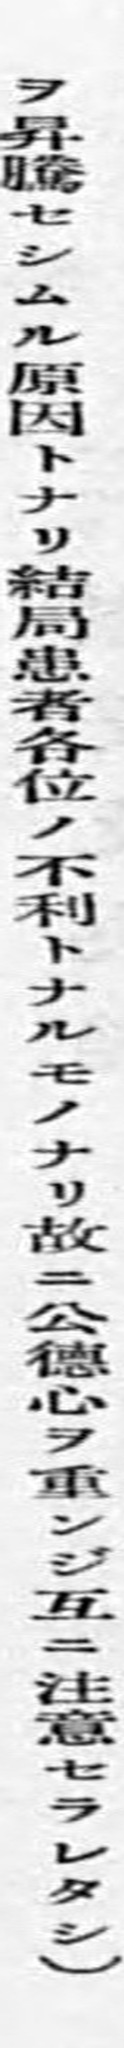ヲ昇騰セシムル原因トナリ結局患者各位ノ不利トナルモノナリ故ニ公徳心ヲ重ンジ互ニ注意セラレタシ)
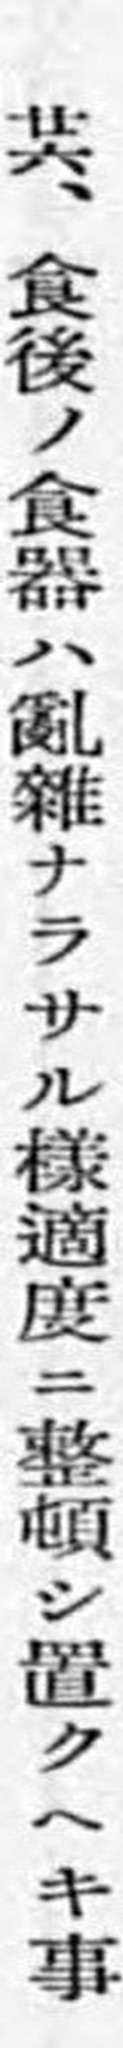廿六、食後ノ食器ハ乱雑ナラサル様適度ニ整頓シ置クヘキ事
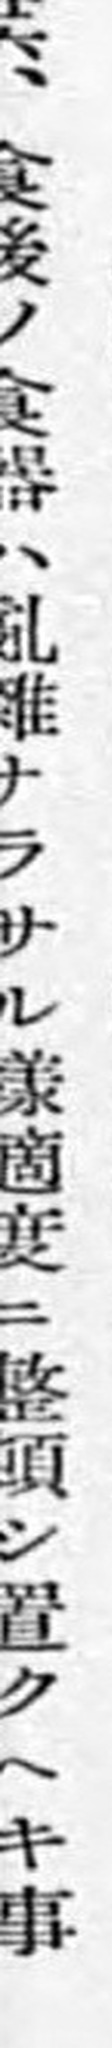廿六、食後ノ食器ハ乱雑ナラサル様適度ニ整頓シ置クヘキ事
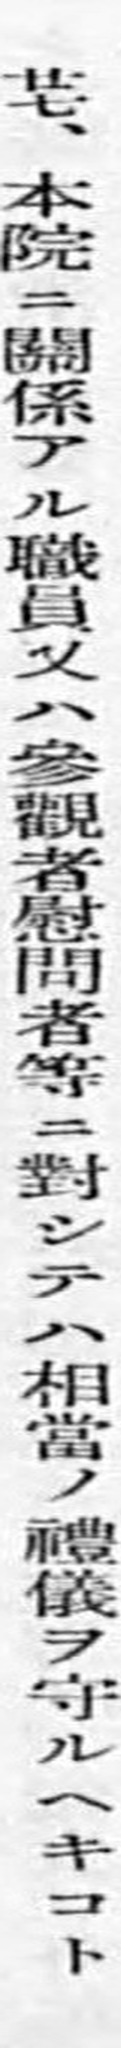廿七、本院ニ関係アル職員又ハ参観者慰問者等ニ対シテハ相当ノ礼儀ヲ守ルヘキコト
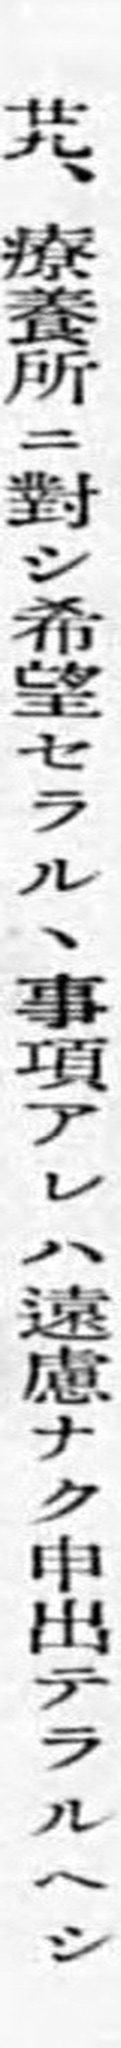廿九、療養所ニ対シ希望セラルヽ事項アレハ遠慮ナク申出テラルヘシ
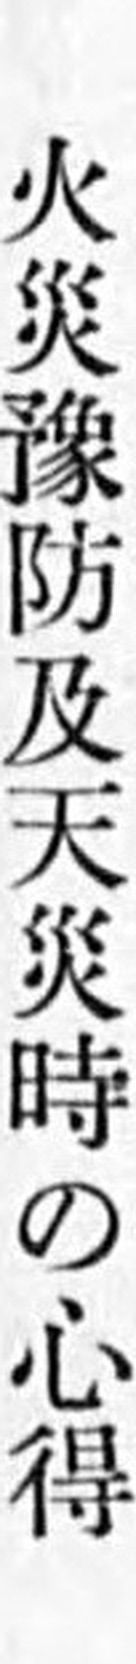火災予防及天災時の心得
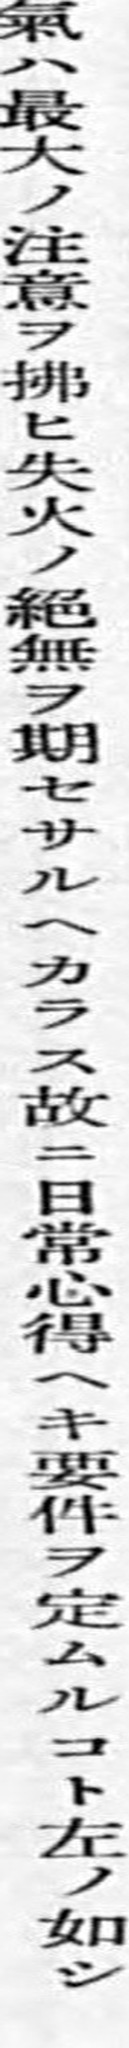火気ハ最大ノ注意ヲ払ヒ失火ノ絶無ヲ期セサルヘカラス故ニ日常心得へキ要件ヲ定ムルコト左ノ如シ
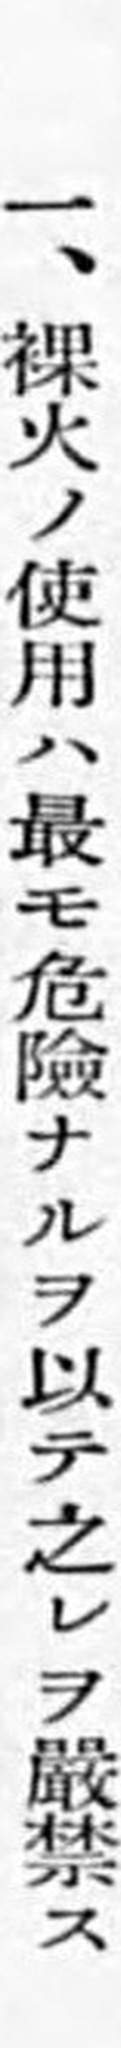一、裸火ノ使用ハ最モ危険ナルヲ以テ之レヲ厳禁ス
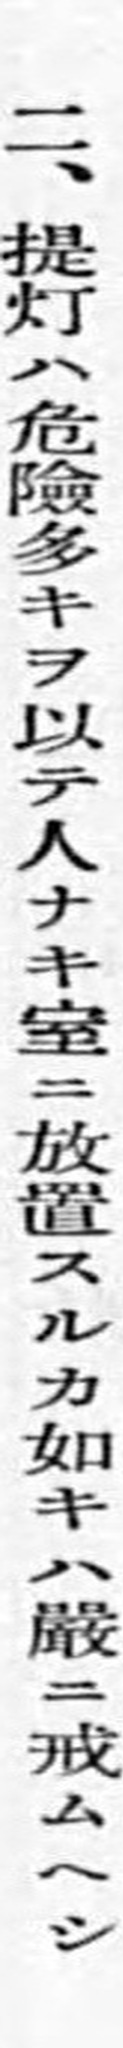二、提灯ハ危険多キヲ以テ人ナキ室ニ放置スルカ如キハ厳ニ戒ムヘシ
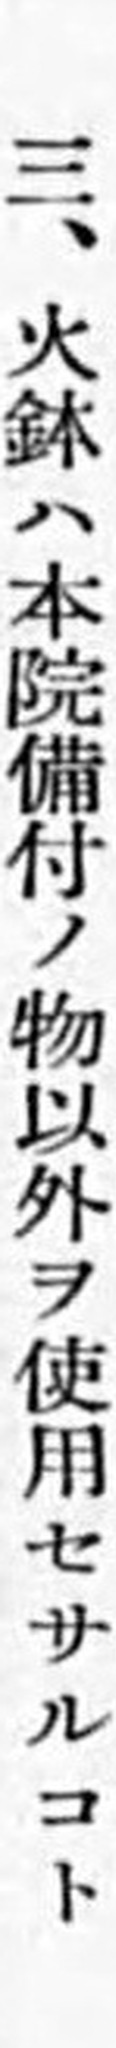三、火鉢ハ本院備付ノ物以外ヲ使用セサルコト
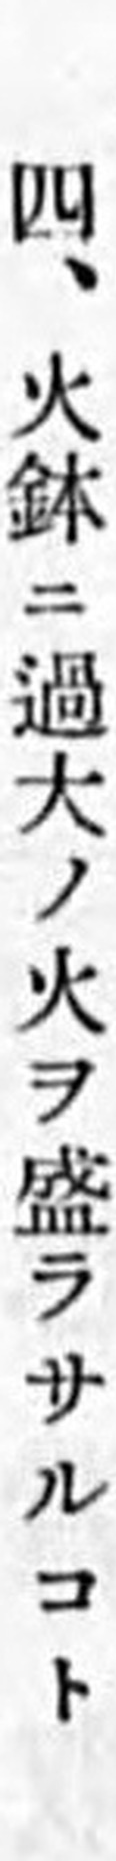四、火鉢ニ過大ノ火ヲ盛ラサルコト
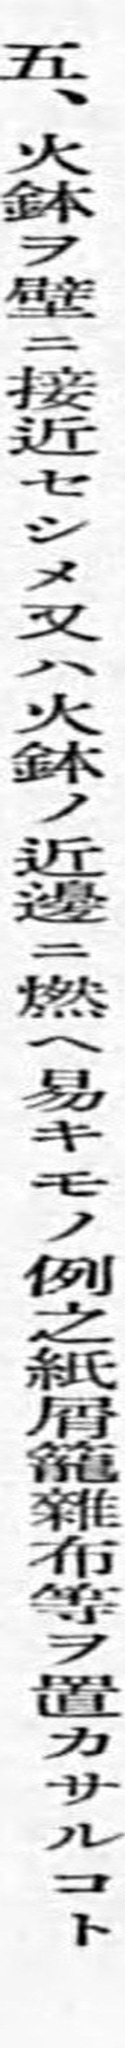五、火鉢ヲ壁ニ接近セシメ又ハ火鉢ノ近辺ニ燃ヘ易キモノ例之紙屑籠雑布等ヲ置カサルコト
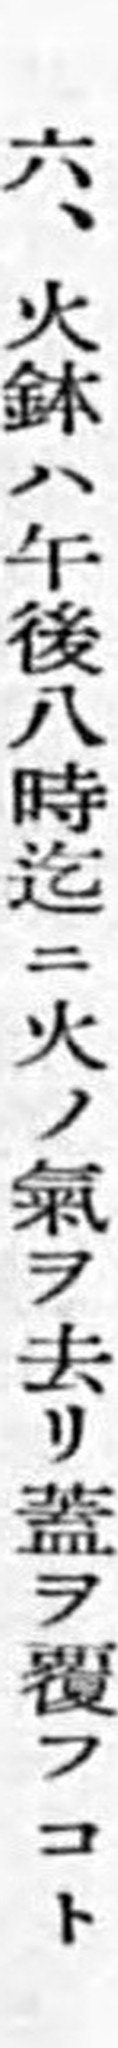六、火鉢ハ午後八時迄ニ火ノ気ヲ去り蓋ヲ覆フコト
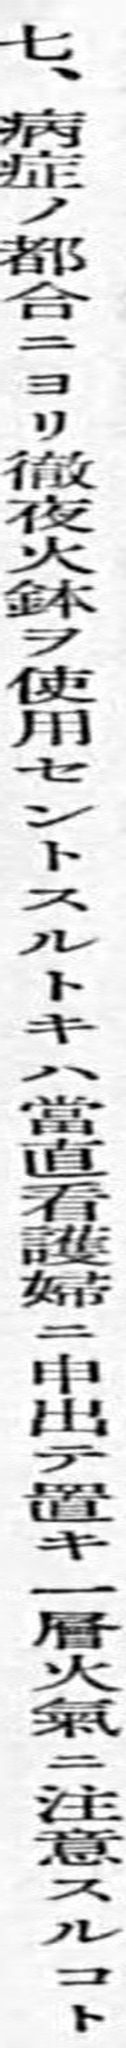七、病症ノ都合ニヨリ徹夜火鉢ヲ使用セントスルトキハ当直看護婦ニ申出テ置キ一層火気ニ注意スルコト
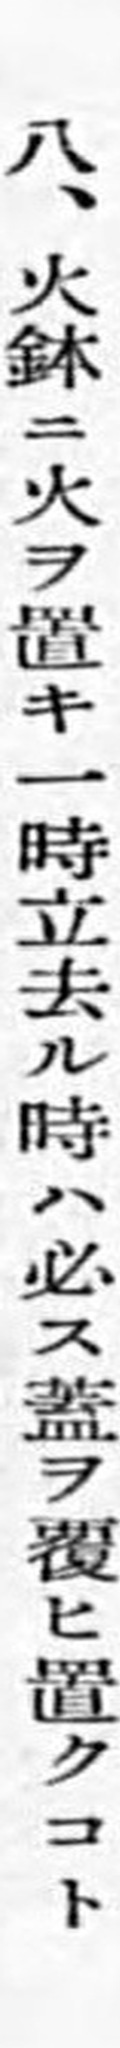八、火鉢ニ火ヲ置キ一時立去ル時ハ必ス蓋ヲ覆ヒ置クコト
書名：豊橋市立高山病院年報. 昭和12年度
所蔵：国立国会図書館 National Diet Library, JAPAN
